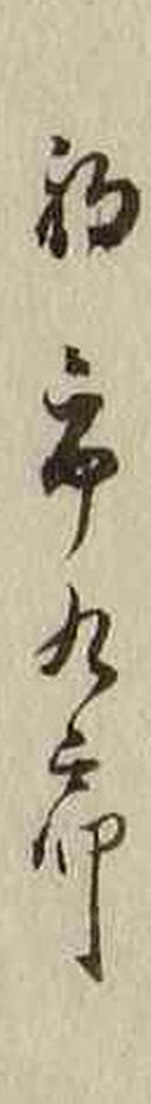初市九郎
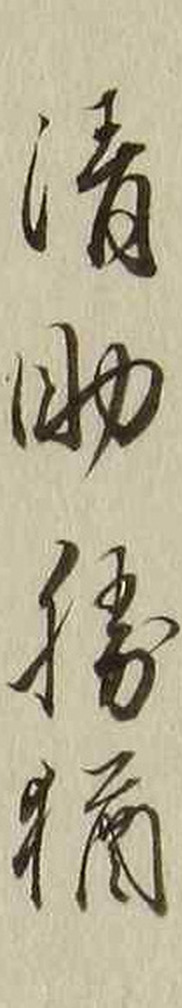清助勝猶
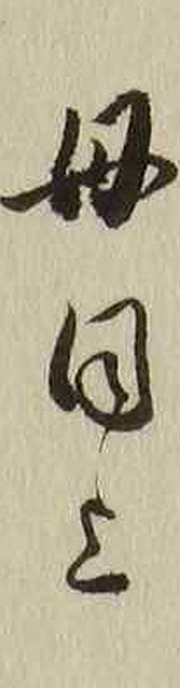母同上
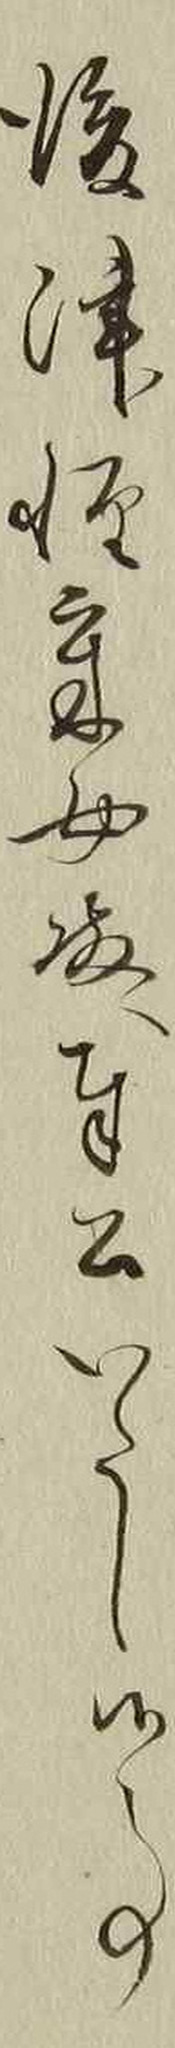後津怪しき女殿へ奉公いたし候事
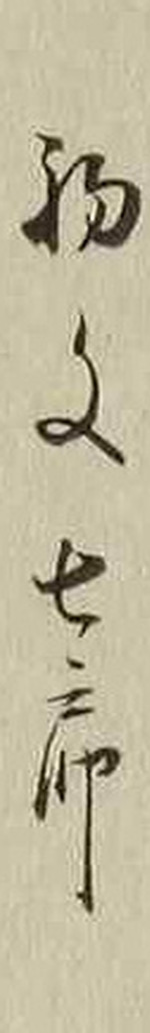初文七郎
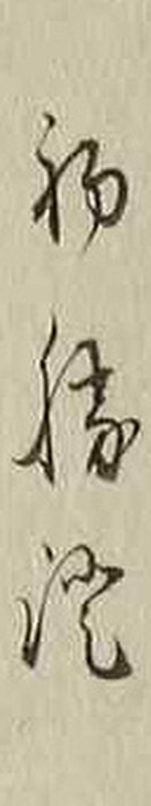初勝證
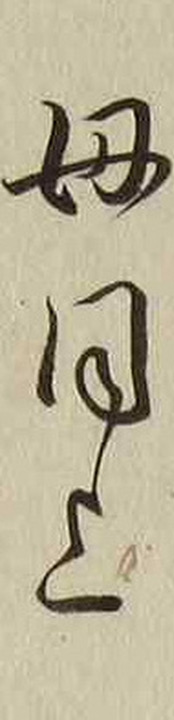母同上
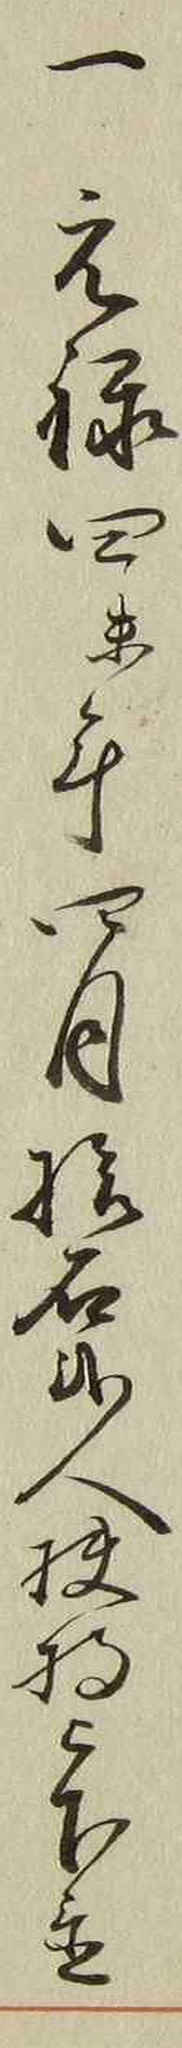一元禄四未年四月拾石弐人扶持下し置かれ

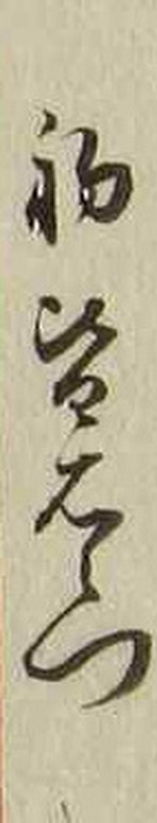初皆右衛門
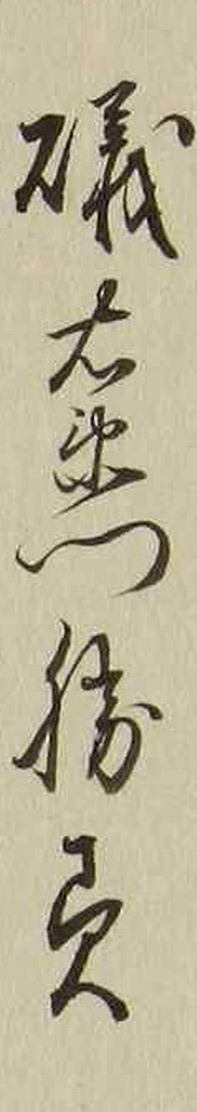磯右衛門勝美
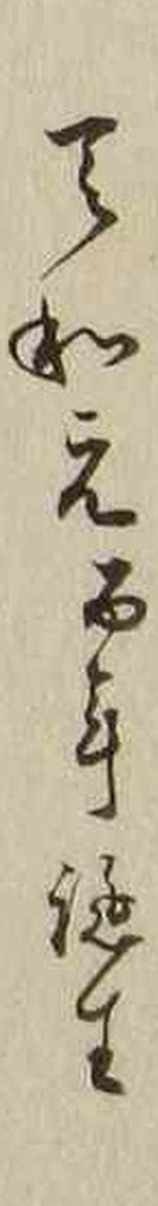天和元酉年誕生
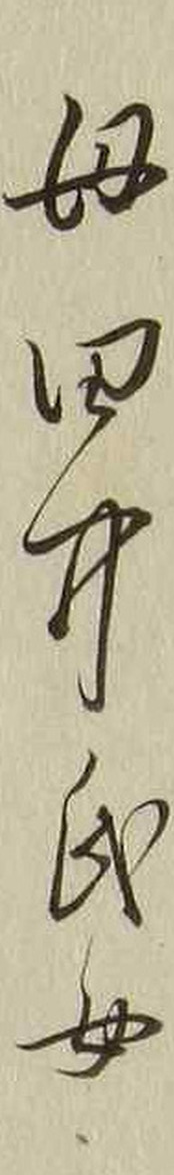母田中氏女
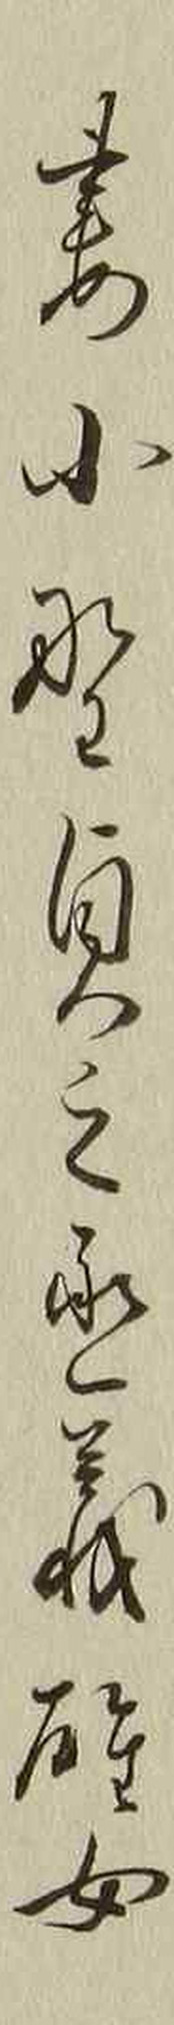妻小野貞之丞義雄女
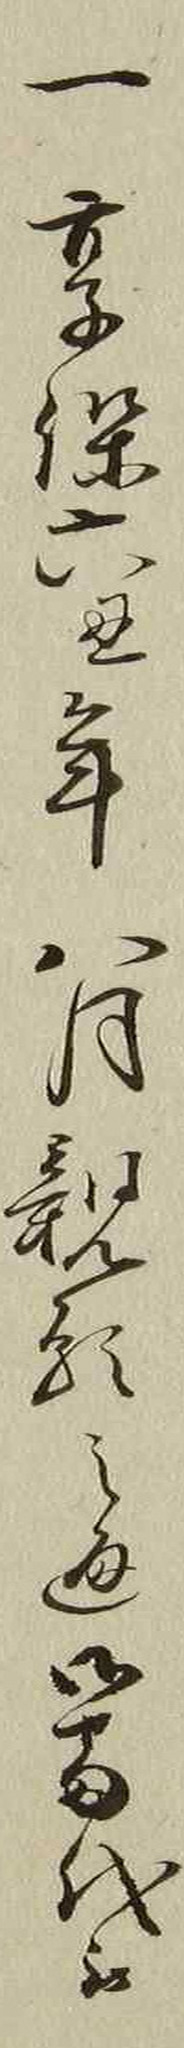一享保六丑年八月親願い之通り御番代
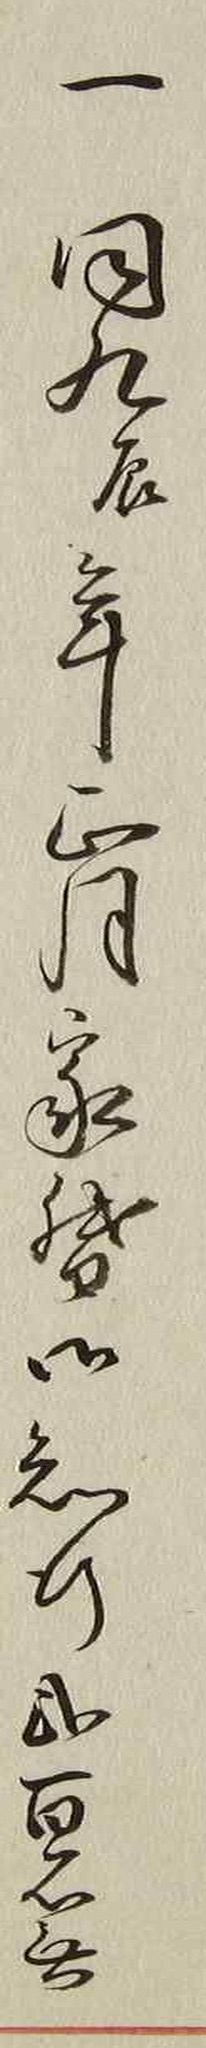一同九月辰年正月家督御知行弐百石
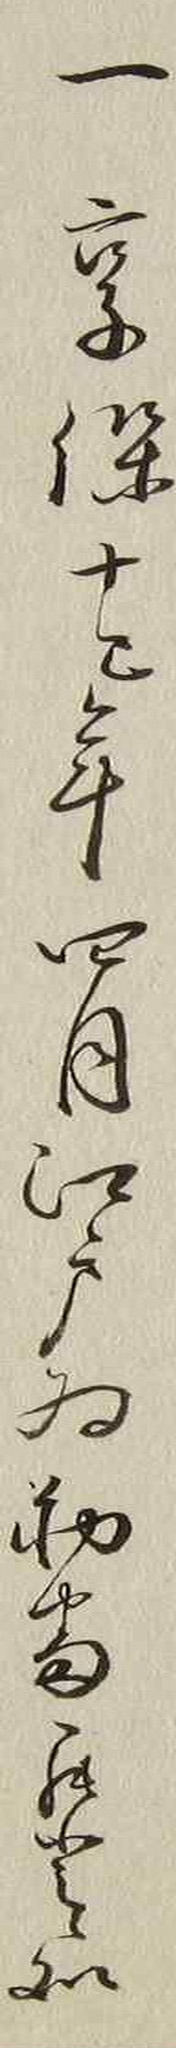一享保十巳年四月江戸勤番之為罷り登り候処
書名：諸士系譜　巻之20　い之部20
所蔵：会津若松市立会津図書館
